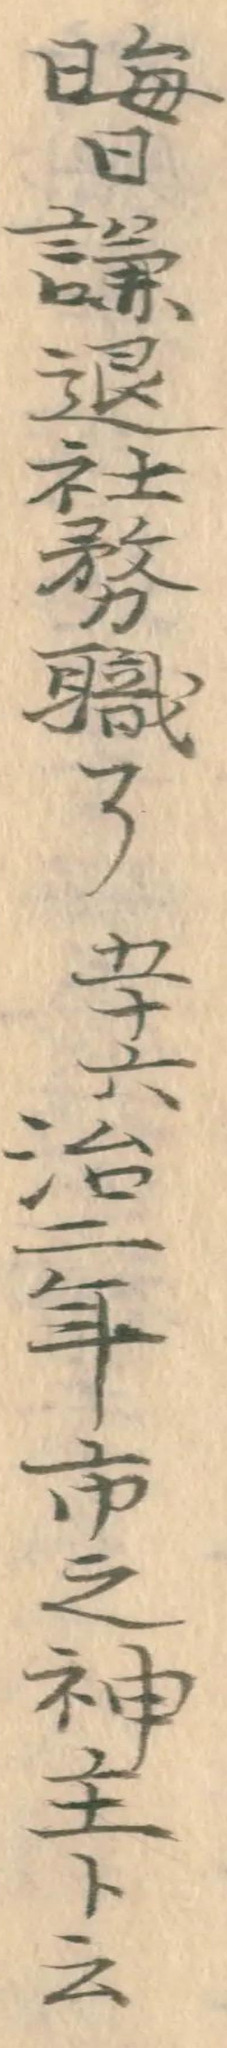晦日謙退社務職了五十六治二年市之神主ト云
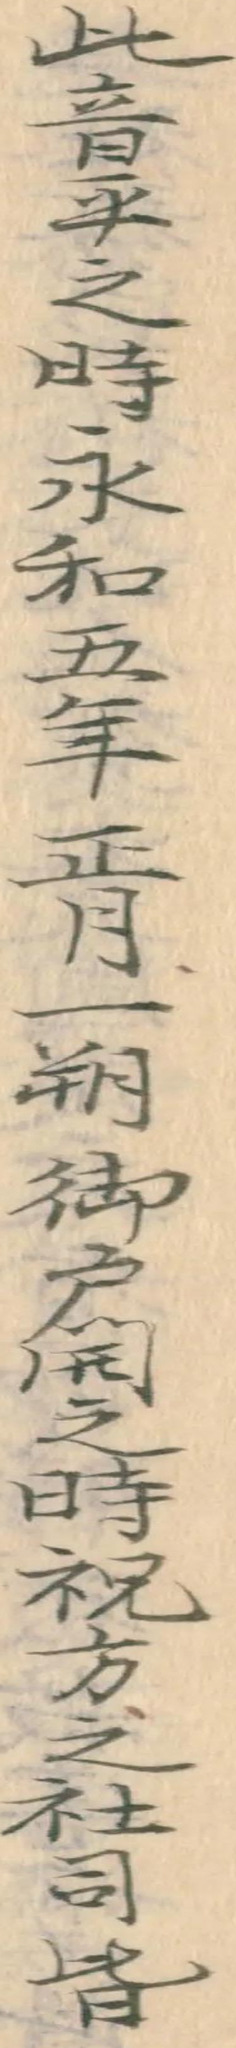此音平之時永和五年正月一朔御戸開之時祝方之社司皆
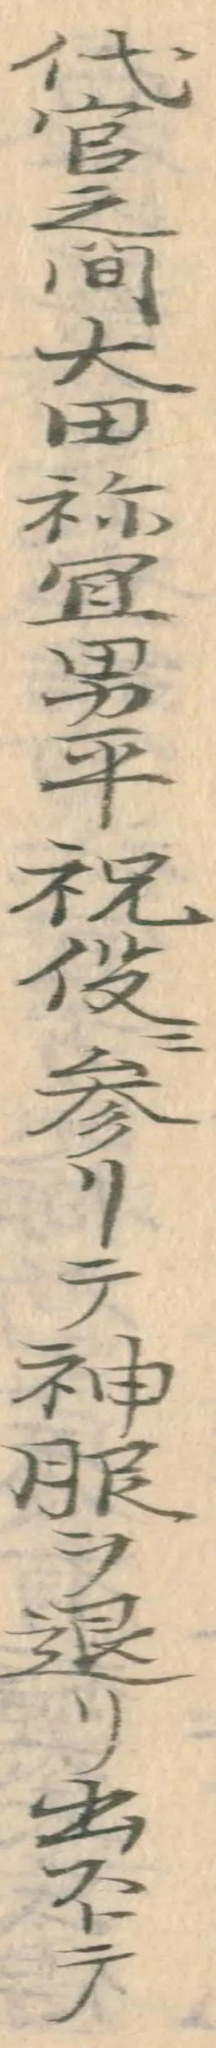代官之間大田祢宜男平祝役ニ参リテ神服ヲ退リ出ストテ
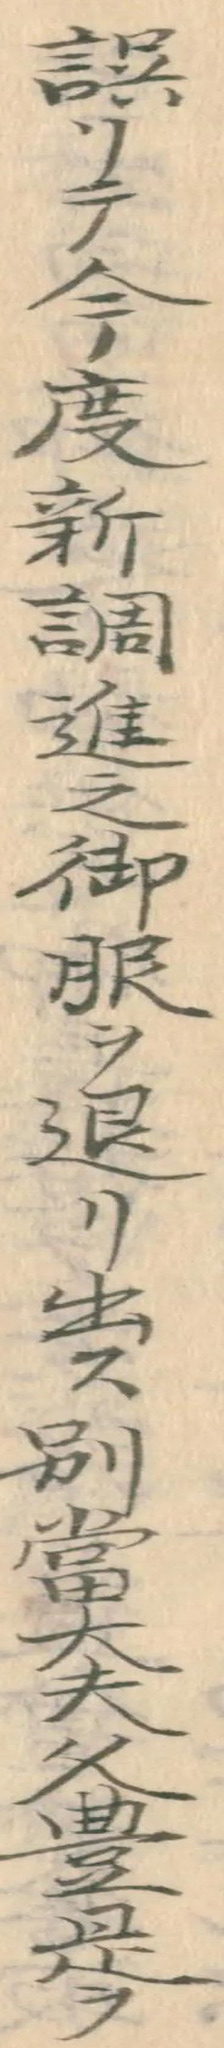誤リテ今度新調進之御服ヲ退リ出ス別当大夫久豊是ヲ
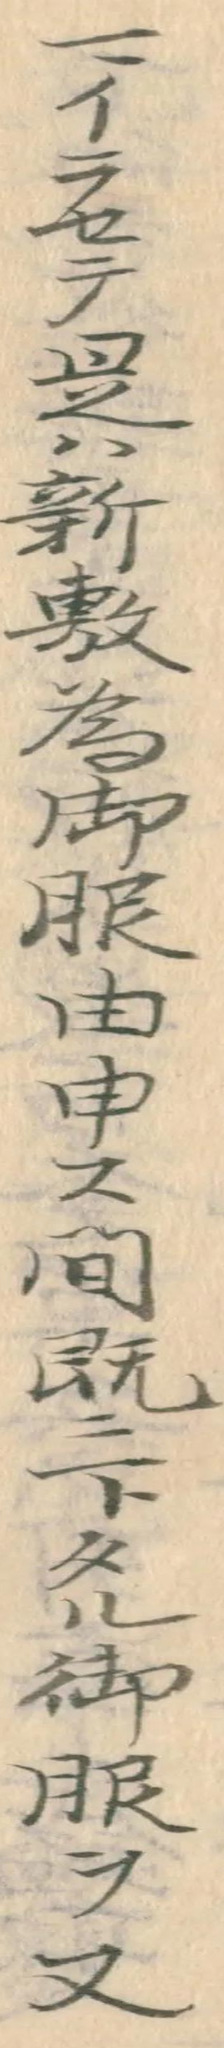マイラセテ是ハ新敷為御服由申ス間既ニ下タル御服ヲ又
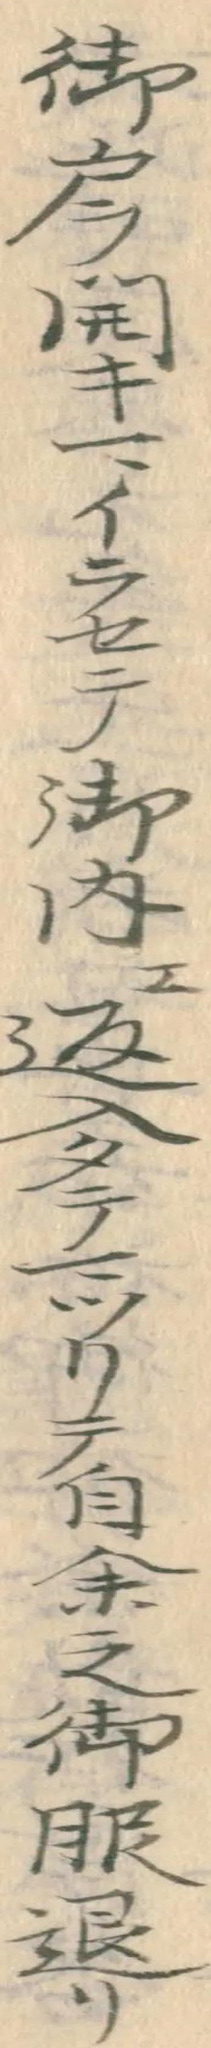御戸ヲ開キマイラセテ御内エ返入タテマツリテ自余之御服退リ
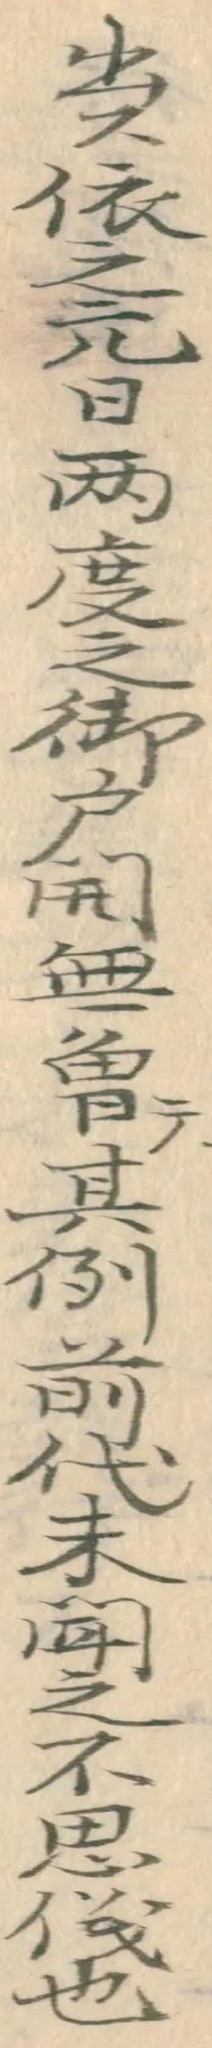出ス依之元日両度之御戸開無曽テ其例前代未聞之不思儀也
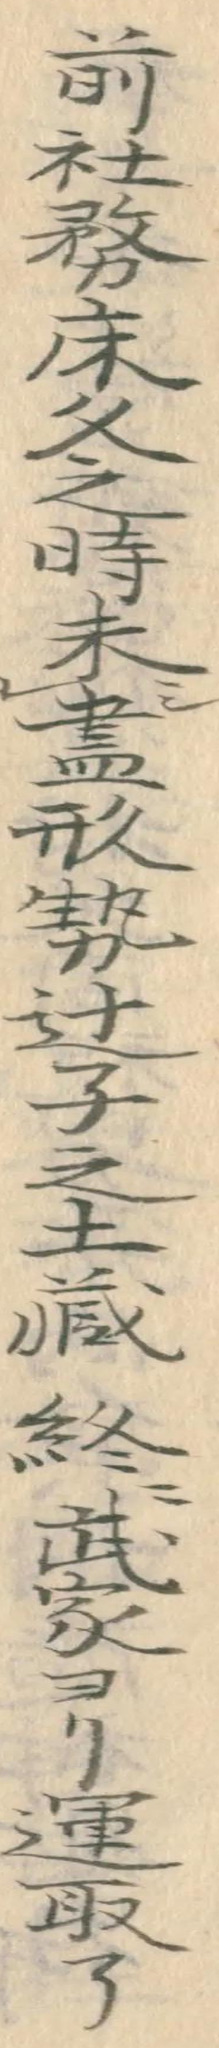前社務床久之時未シ尽形勢辻子之土蔵終ニ武家ヨリ運取了
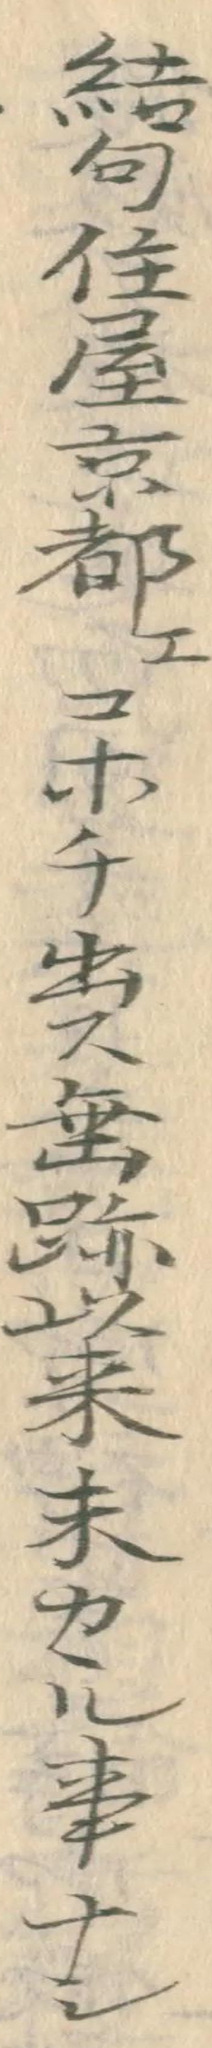結句住屋京都エコホチ出ス垂跡以来未カヽル事ナシ
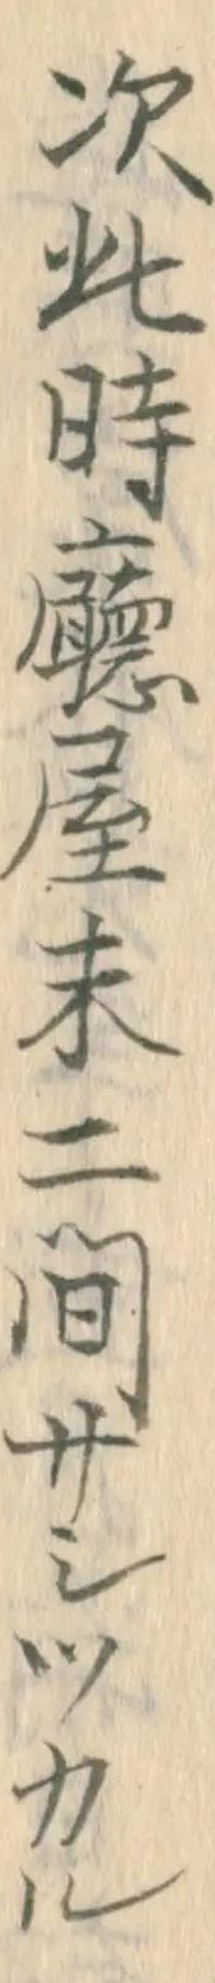次此時庁屋末二間サシツカル
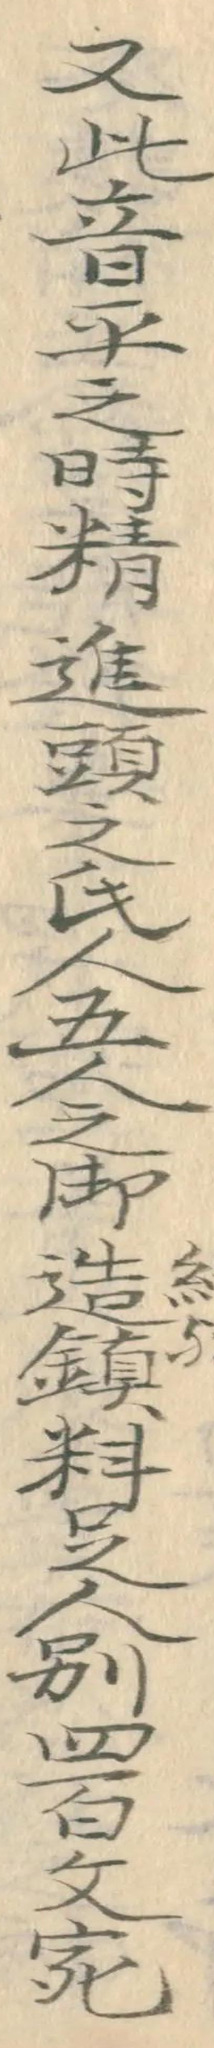又此音平之時精進頭之氏人五人之御造鎮料足人別四百文宛
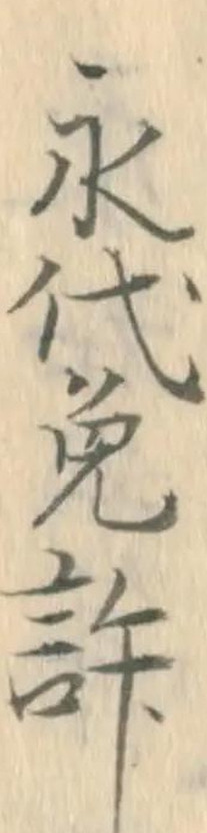永代免許

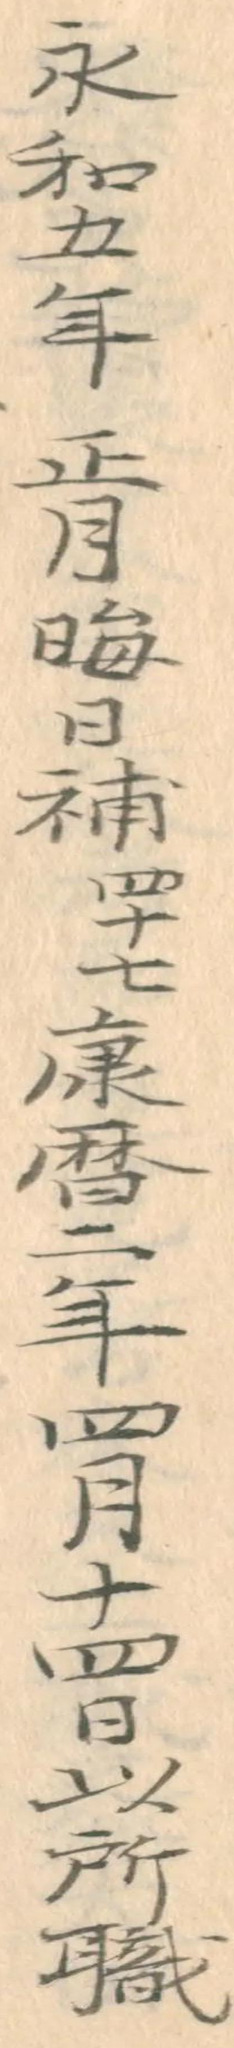永和五年正月晦日補四十七康暦二年四月十四日以所職
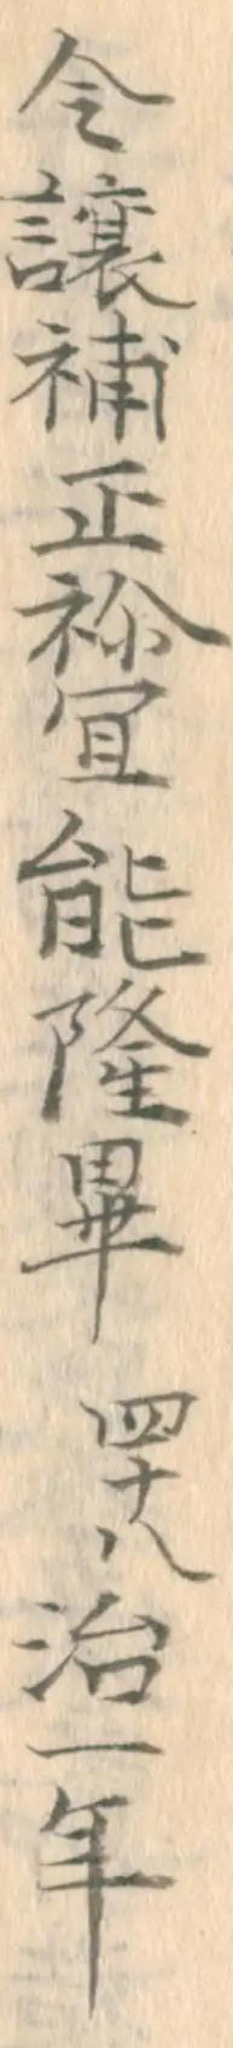令譲補正祢宜能隆畢四十八治一年
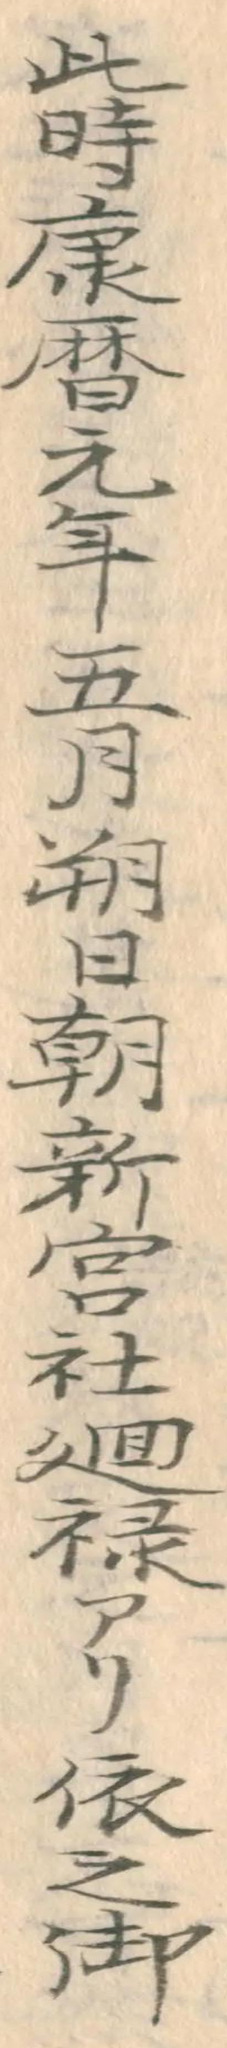此時康暦元年五月朔日朝新宮社廻禄アリ依之御
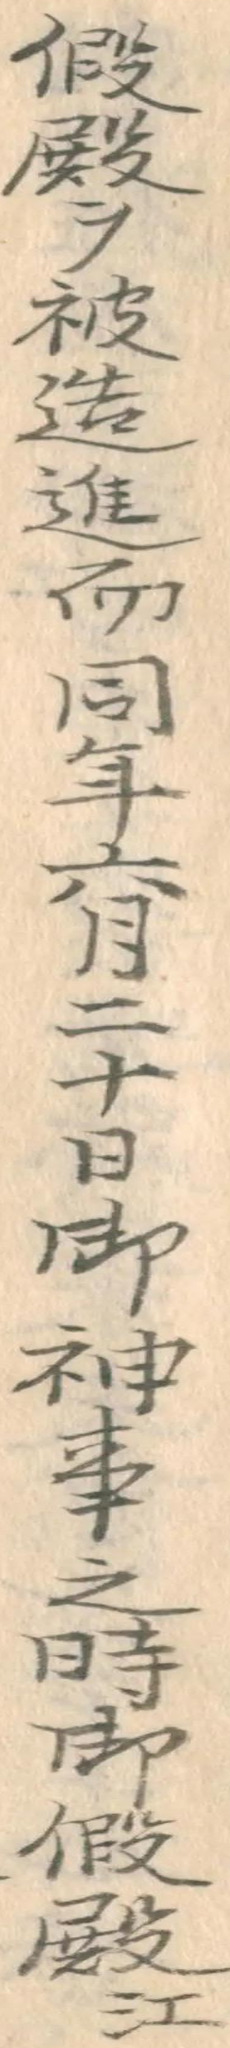仮殿ヲ被造進而同年六月二十日御神事之時御仮殿江
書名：賀茂社記録. 第24冊
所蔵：国立国会図書館 National Diet Library, JAPAN
